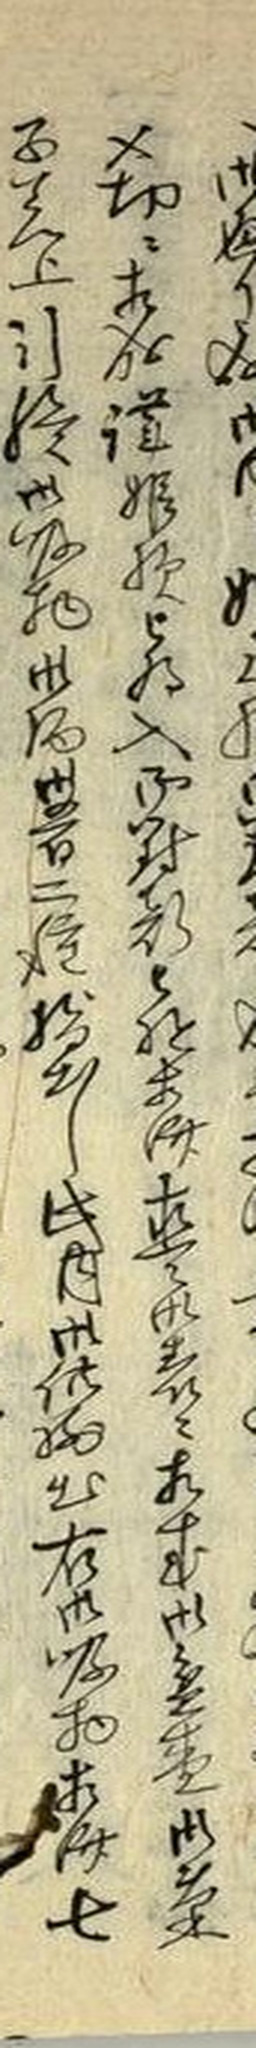子差上引続御吸物御酒御肴二種指出し此内御供揃出右御吸物相済七
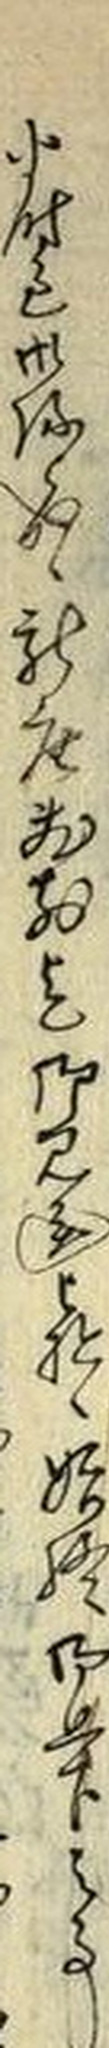半時過御帰被成候新座敷前迄御見送被遊候始終御上下之事
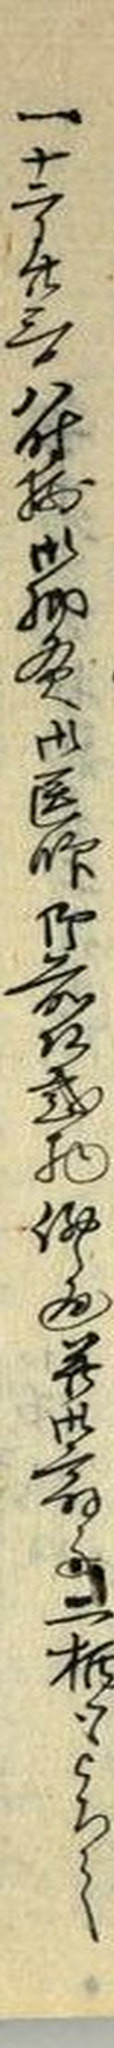一十二月廿三日八時揃御納灸御医師御前頂戴物例之通并御扇子二柄ツヽ被下之
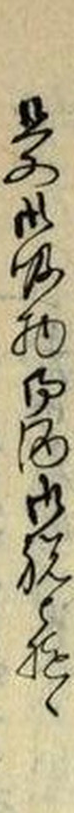且又御吸物御酒御祝被遊候
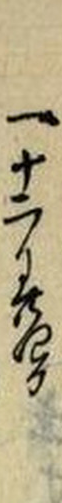一十二月廿四日
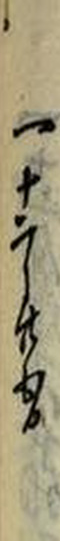一十二月廿四日
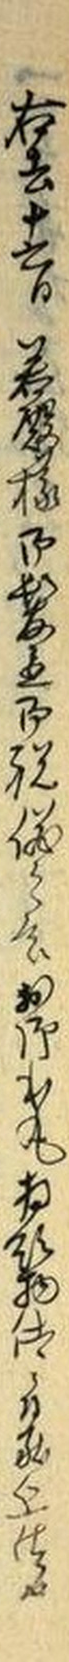右去十六日若殿様御髪置御祝儀之節於御本丸拝領物仕候ニ付献上仕候由
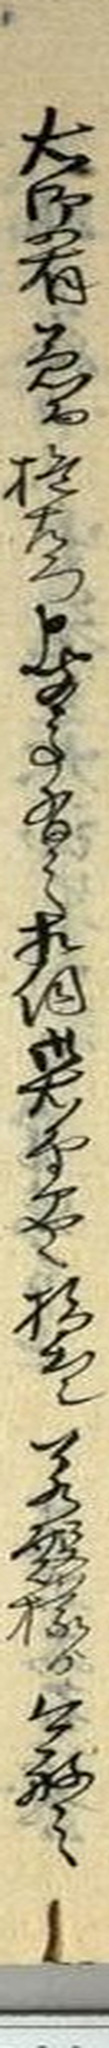右御肴兼而権右衛門申聞候事有之相伺御右筆部やへ指出シ若殿様ゟ今般之
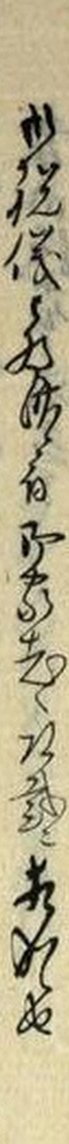御祝儀被為済候ニ付御家老へ頂戴ニ相成候由
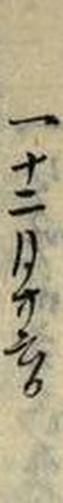一十二月廿四日
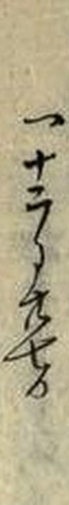一十二月廿四日
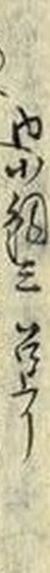内小鯛三召上り
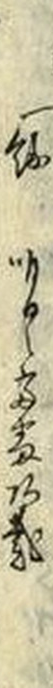余明日之当番頂戴
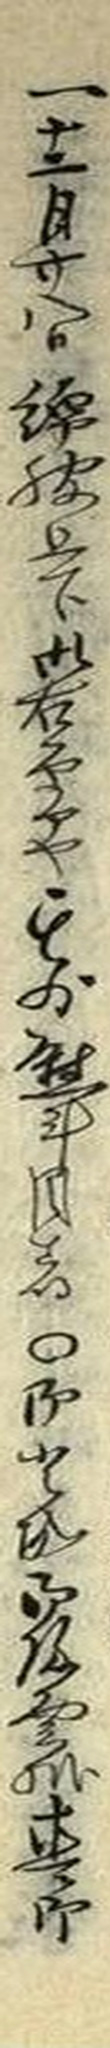一十二月廿八日綿服上下御右筆部や其外熨斗目着〇御登城御帰殿掛直ニ御
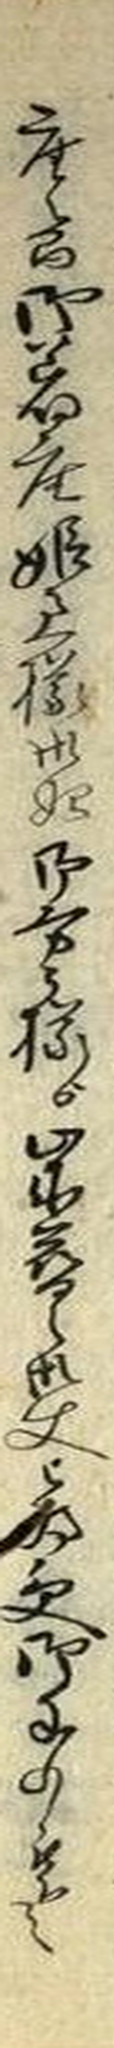座之間御着座姫君様御始御方々様ゟ歳暮之御使被為受御手のし被下之
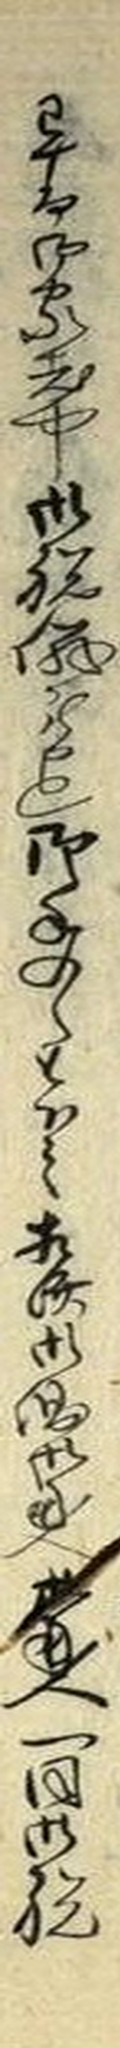畢而御家老中御祝儀被申上御手のし被下之相済御側御用人御用人一同御祝
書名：少傅日録抄（斉承付側向頭取日記、在府）
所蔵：福井県文書館 Fukui Prefectural Archives
